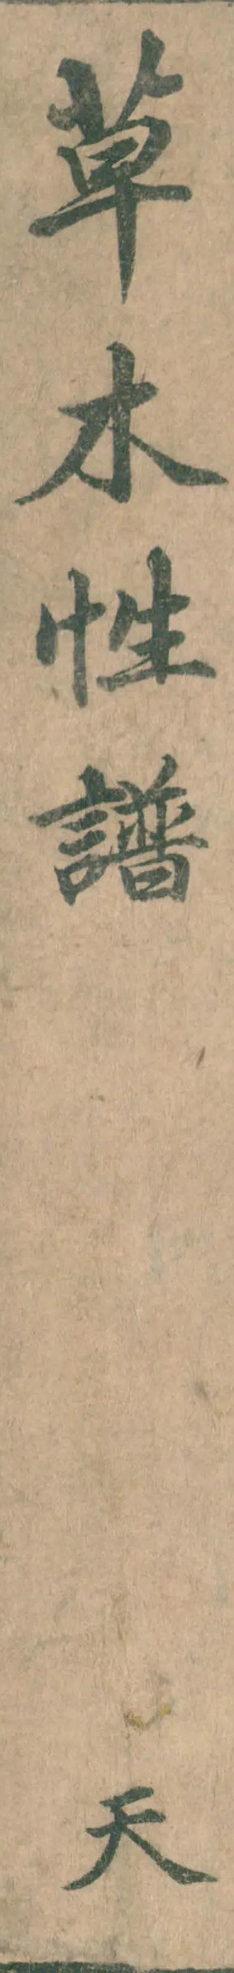草木性譜天

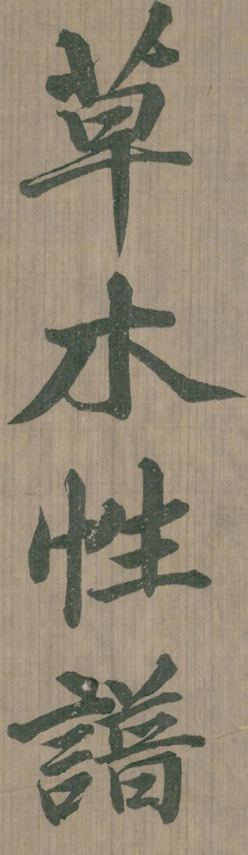草木性譜
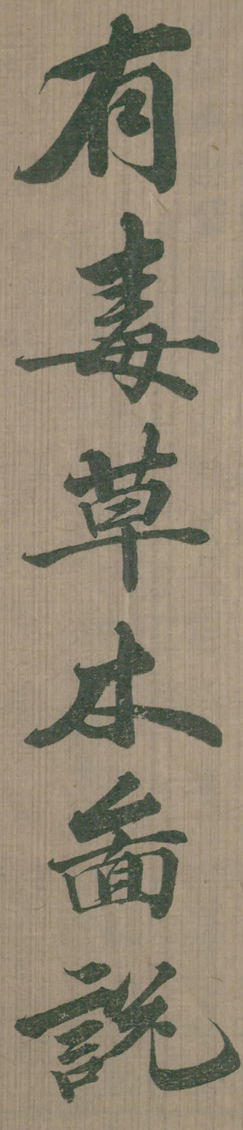有毒草木図説

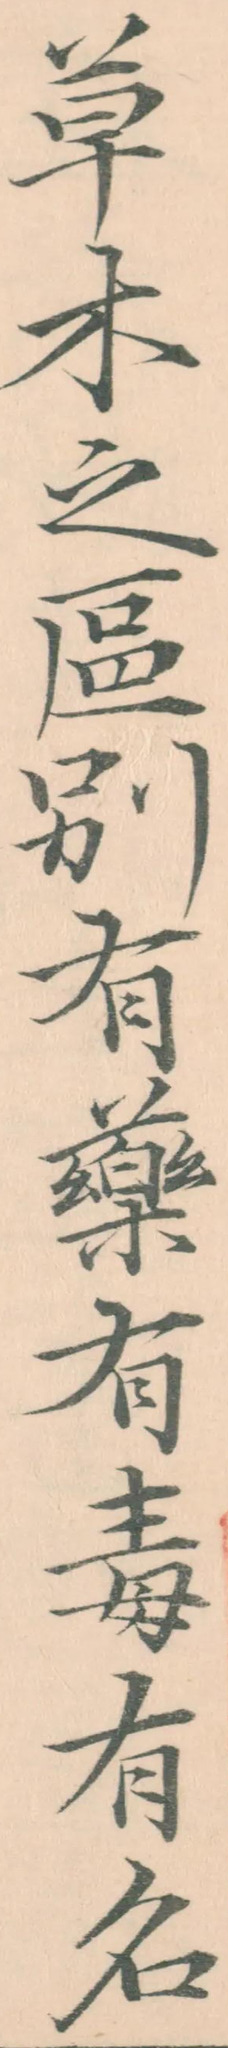草木之區別有薬有毒有名
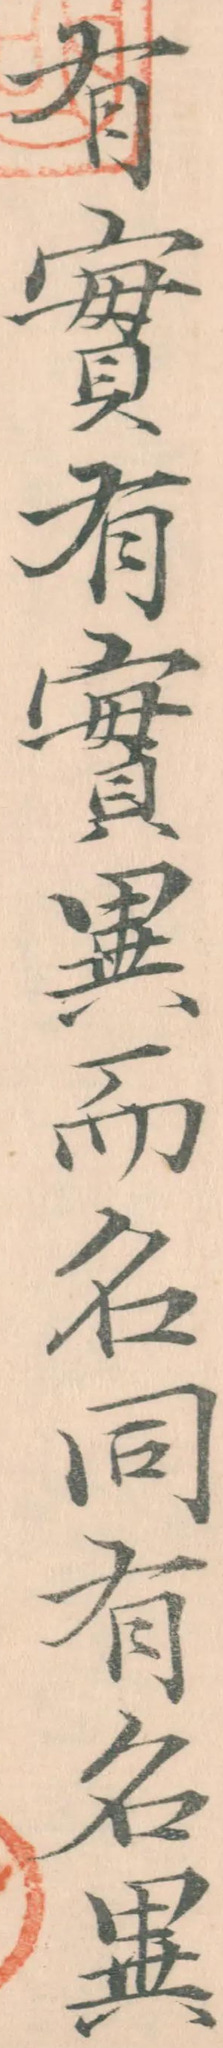有實有實異而名同有名異
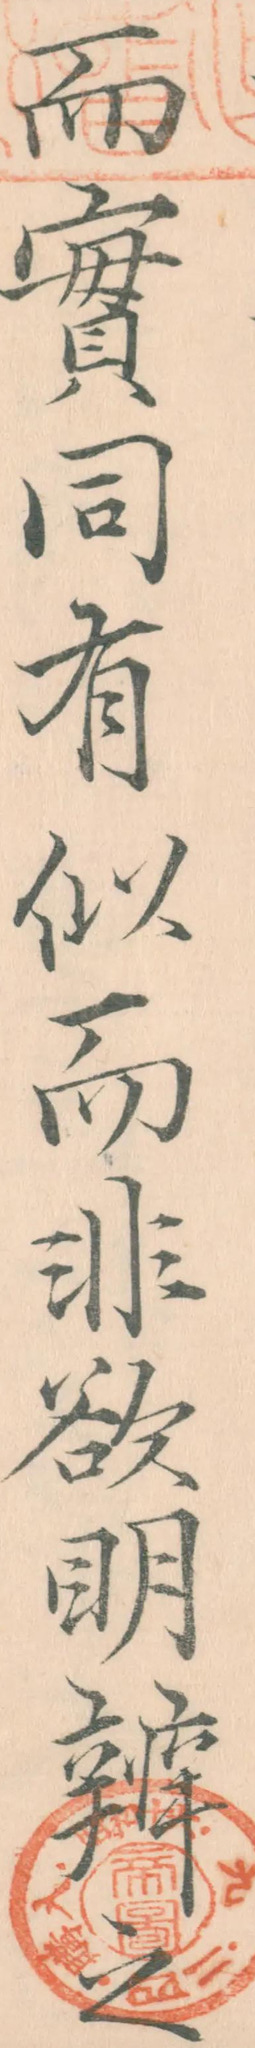而實同有似而非欲明辨之
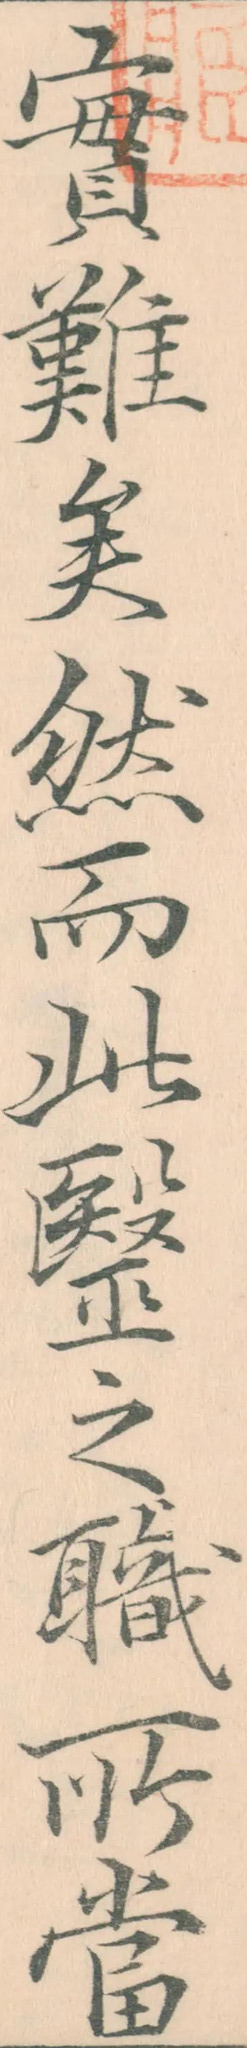實難矣然而此毉之職所當
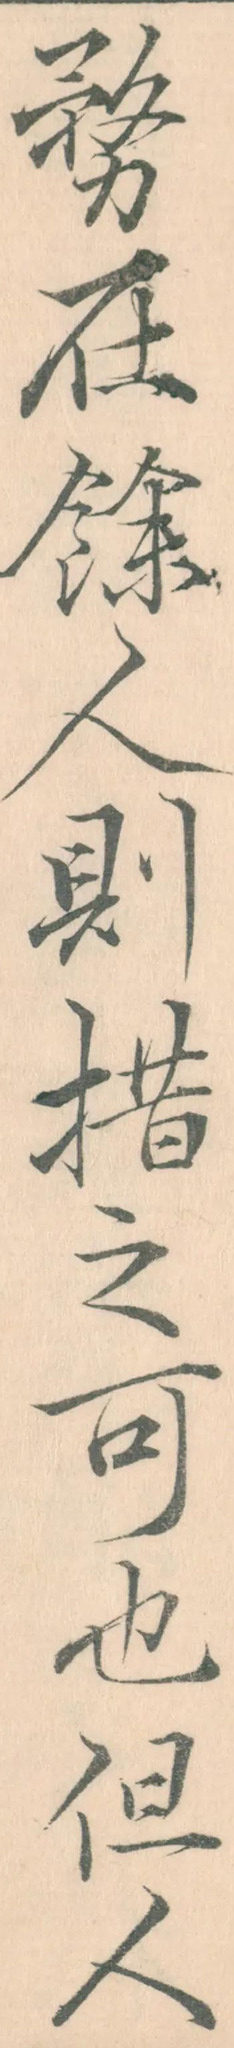務在餘人則措之可也但人
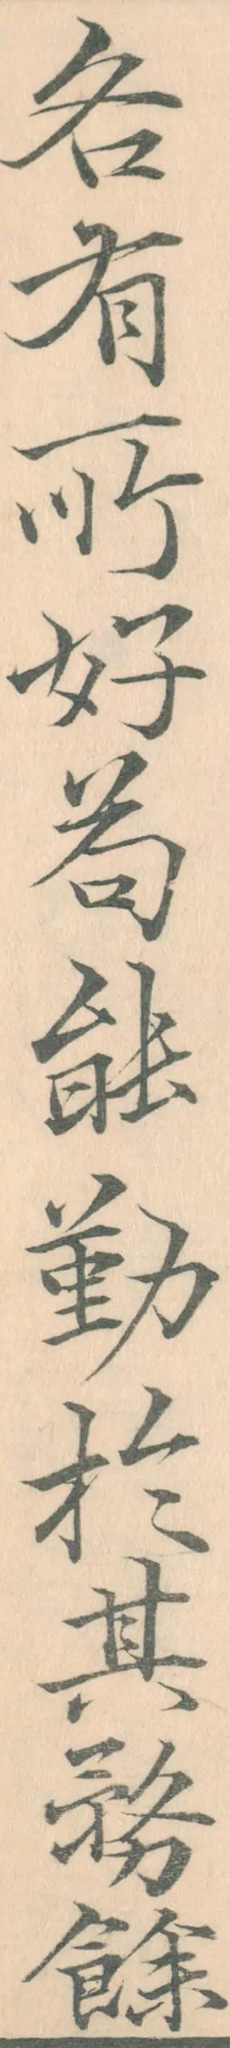各有所好苟能勤於其務餘

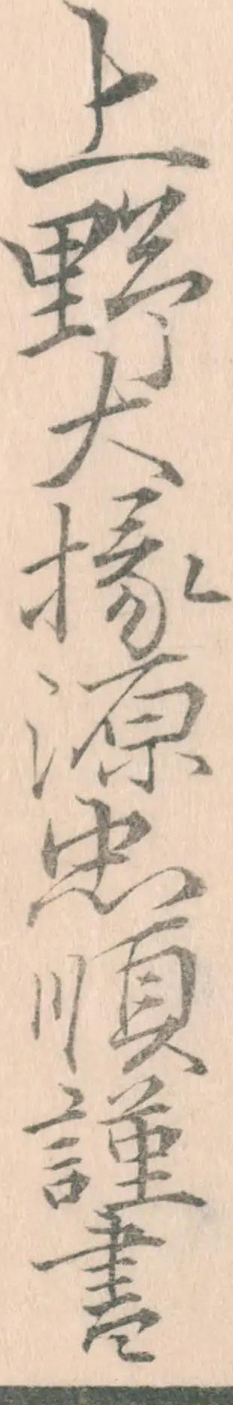上野大掾源源忠順謹書
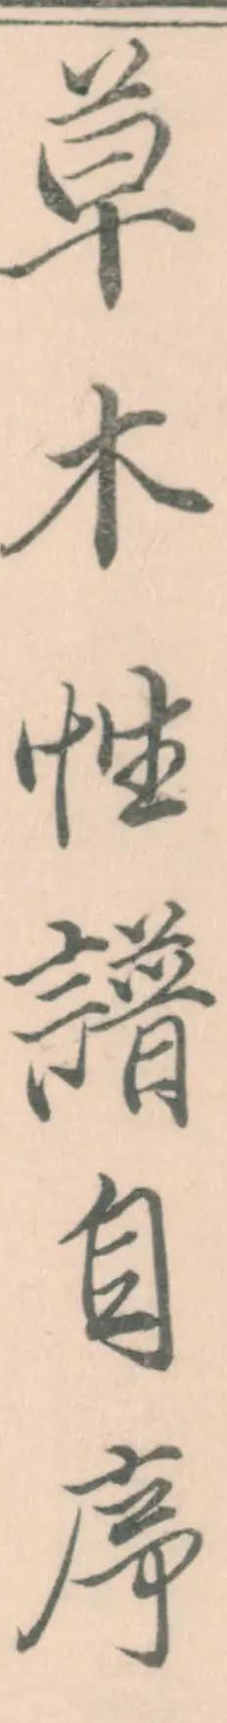草木性譜自序
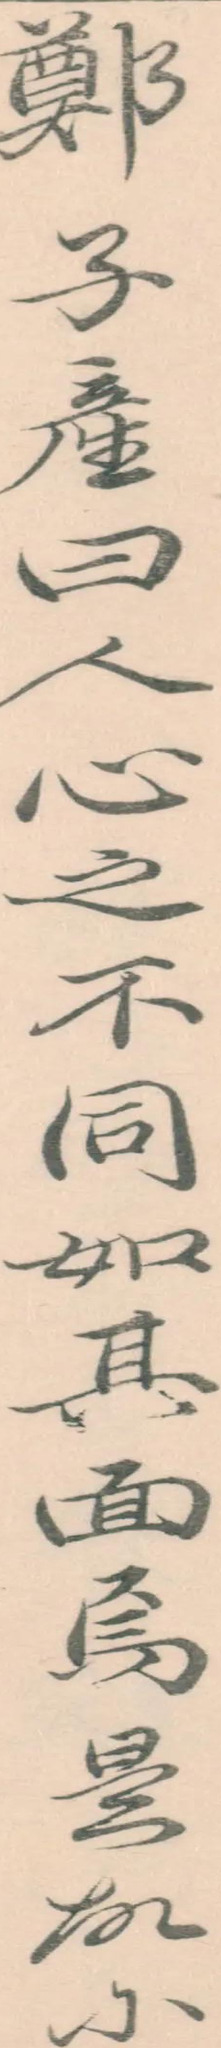鄭子産曰人心之不同如其面焉是故に
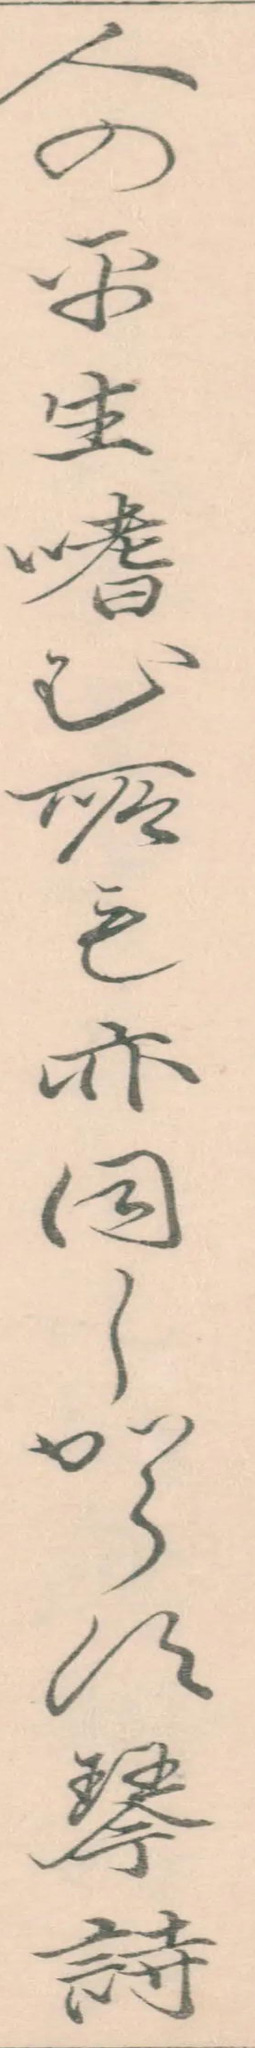人の平生嗜む所も亦同しからす琴詩
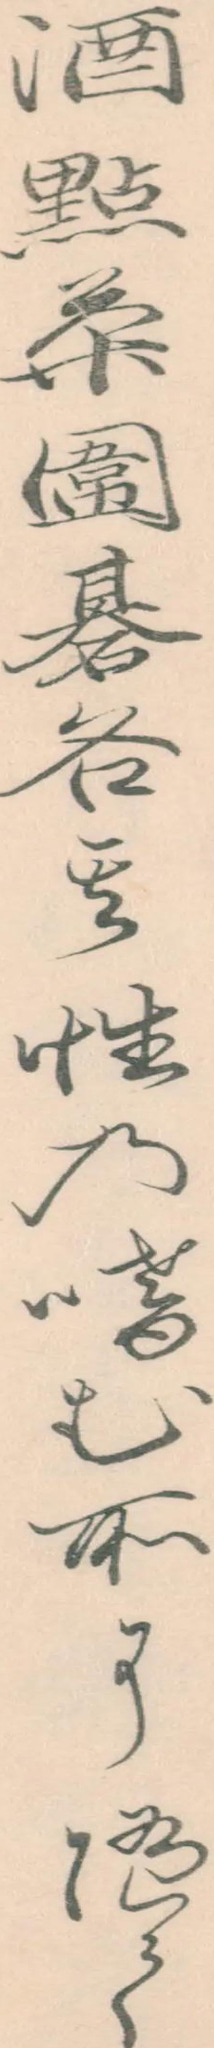酒点茶囲碁各其性の嗜む所に随て
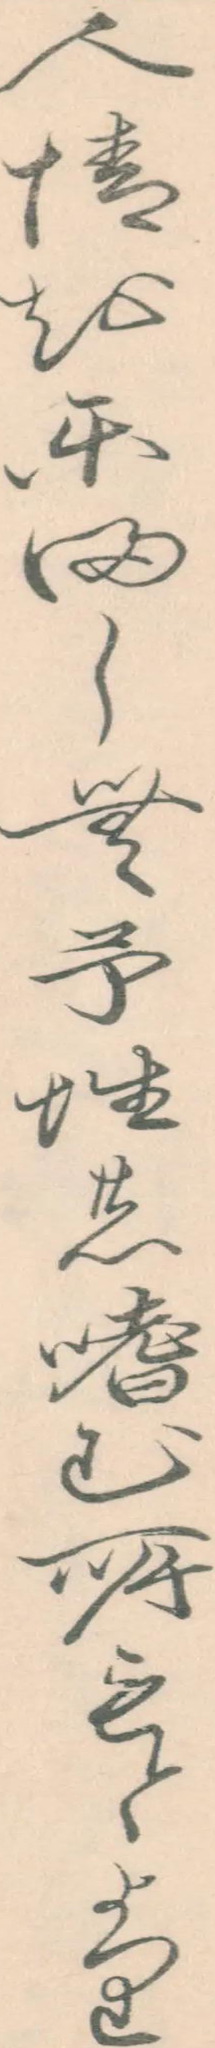人情を楽ましむ予性の嗜む所もとより
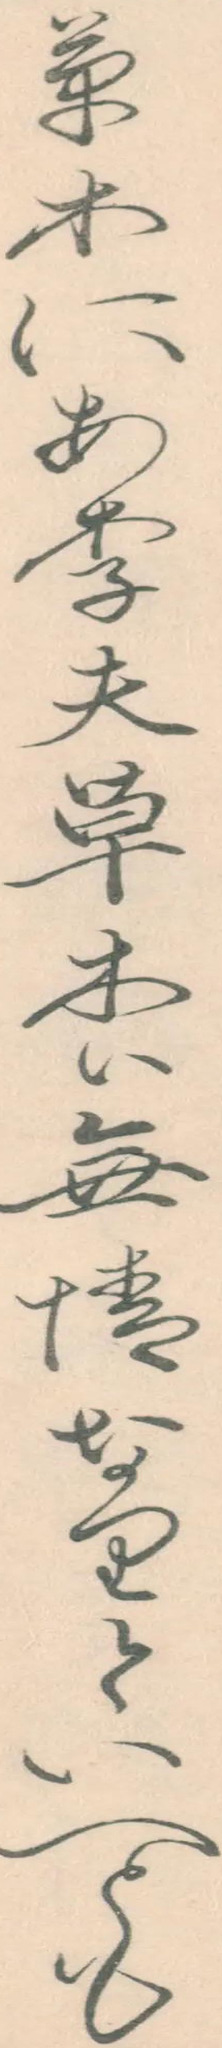草木にあり夫草木は無情なりといへとも
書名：草木性譜 3巻. [1]
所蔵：国立国会図書館 National Diet Library, JAPAN
